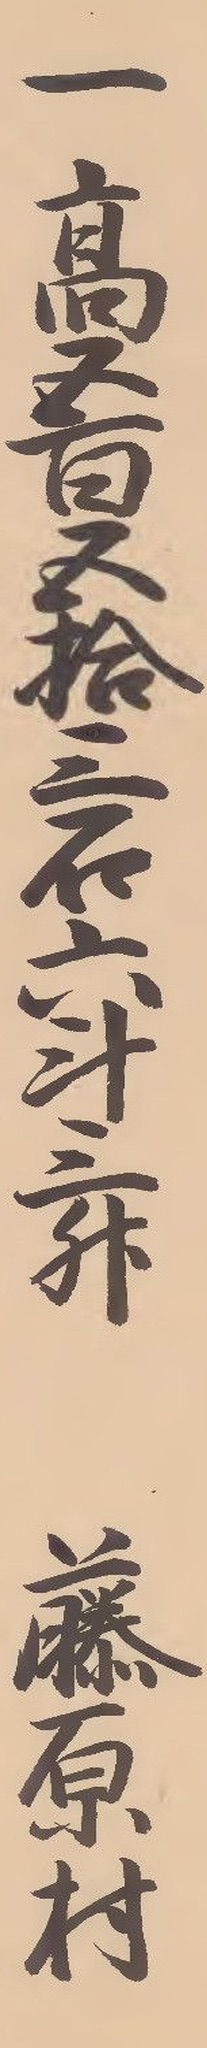一高五百五拾三石六斗三升藤原村
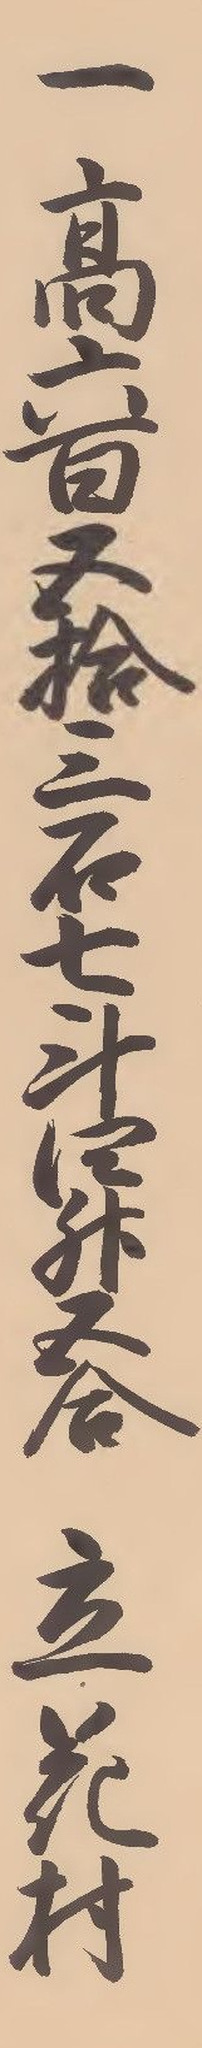一高三百五拾三石七斗四升五合立花村
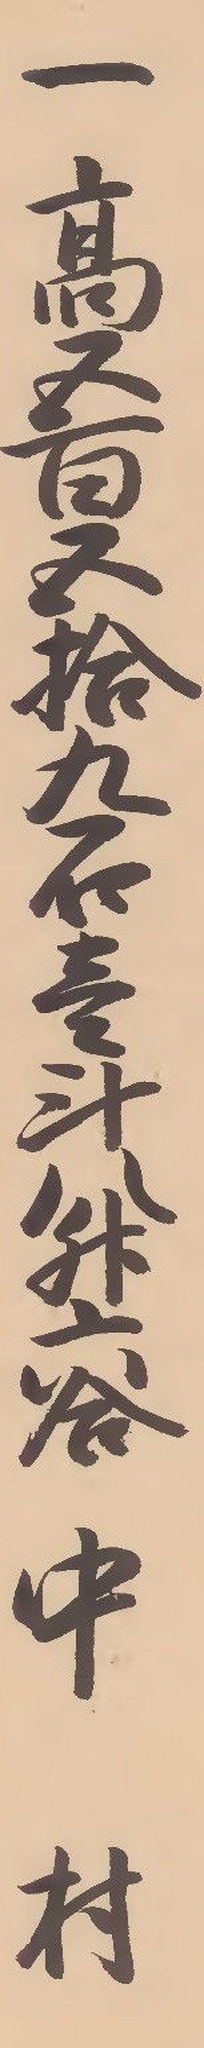一高五百五拾九石壱斗八升六合中村

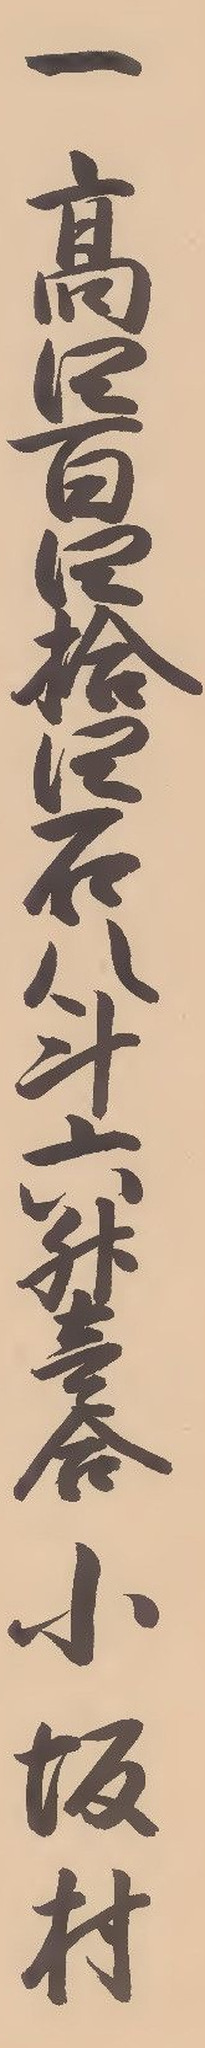一高四百四拾四石八斗六升壱合小坂村
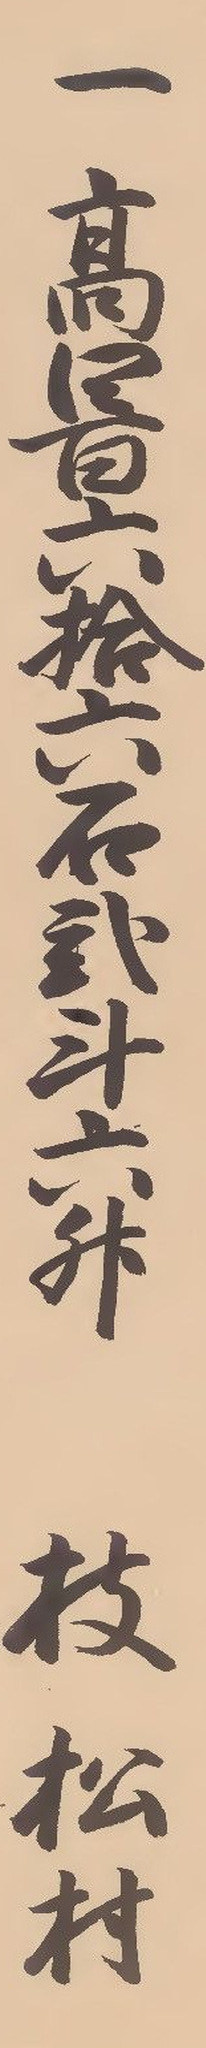一高四百六拾六石弐斗六升枝松村
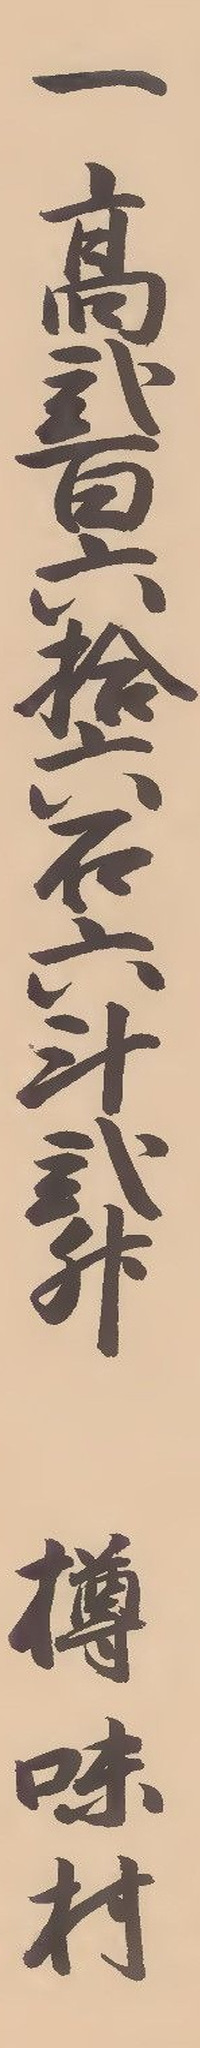一高弐百六拾六石六斗弐升樽味村
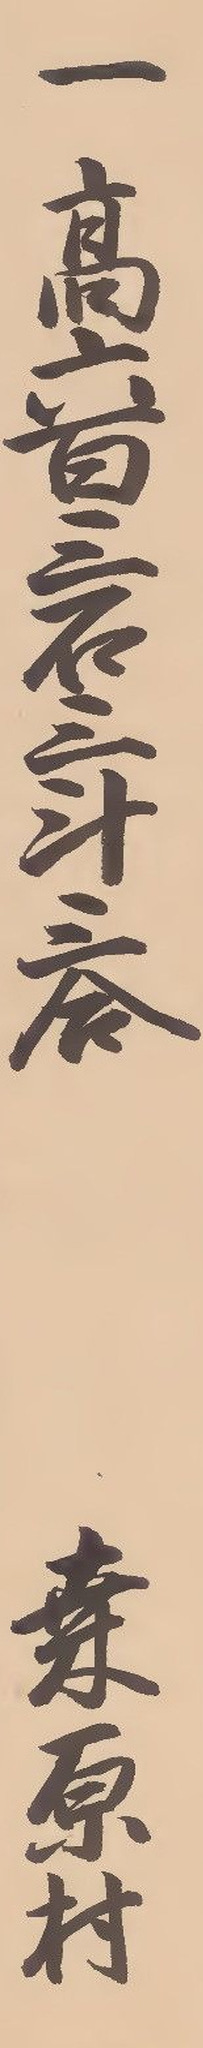一高六百三石三斗三合桑原村
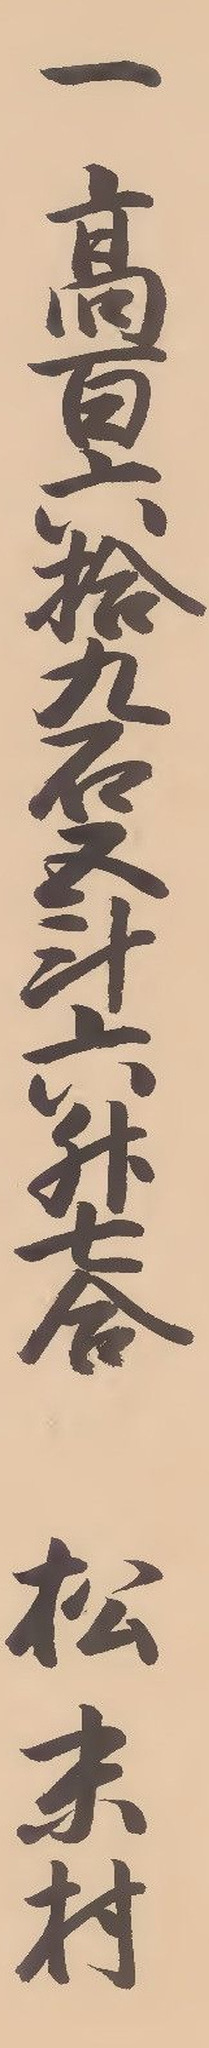一高百六拾九石五斗六升七合松末村
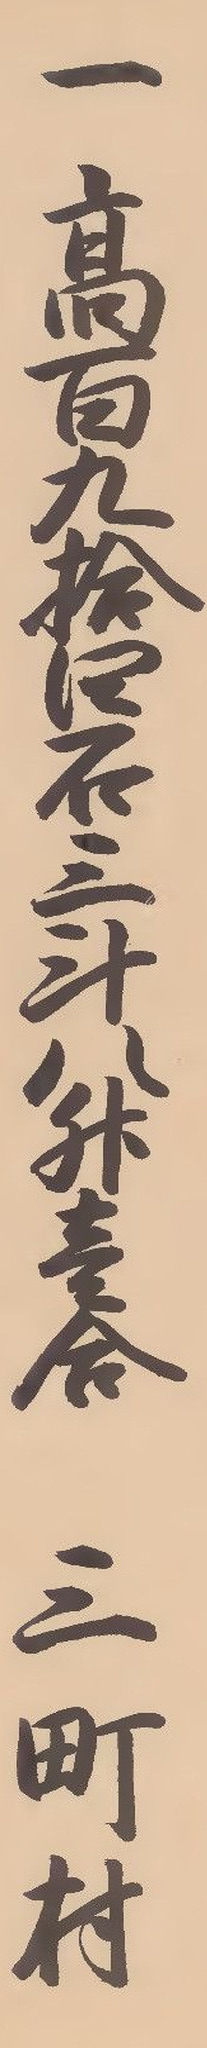一高百九拾四石三斗八升壱合三町村
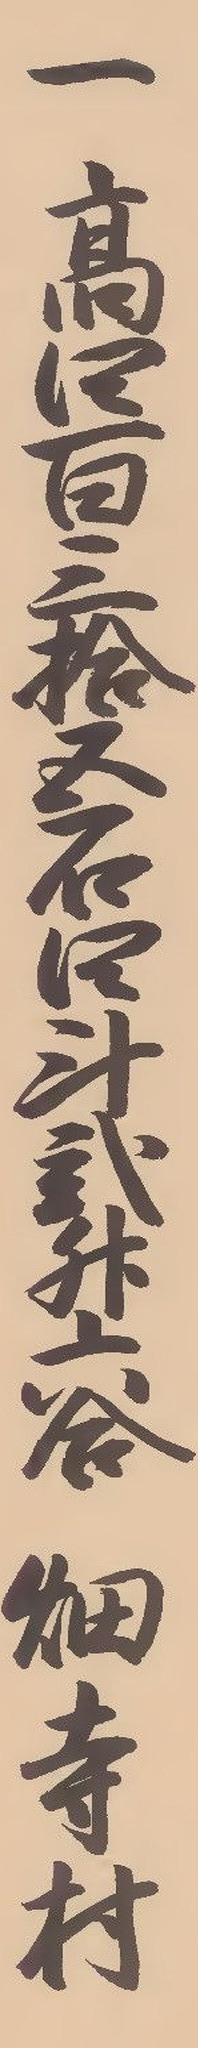一高四百三拾五石四斗弐升六合畑寺村

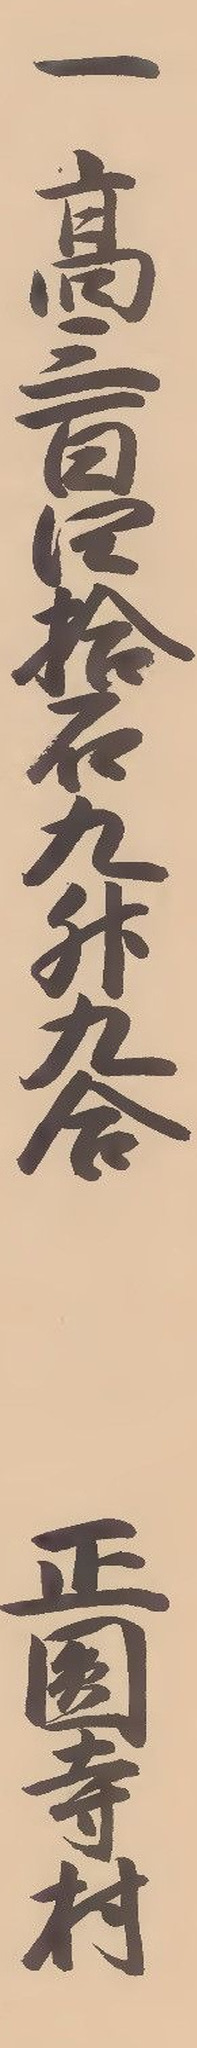一高三百四拾石九升九合正円寺村
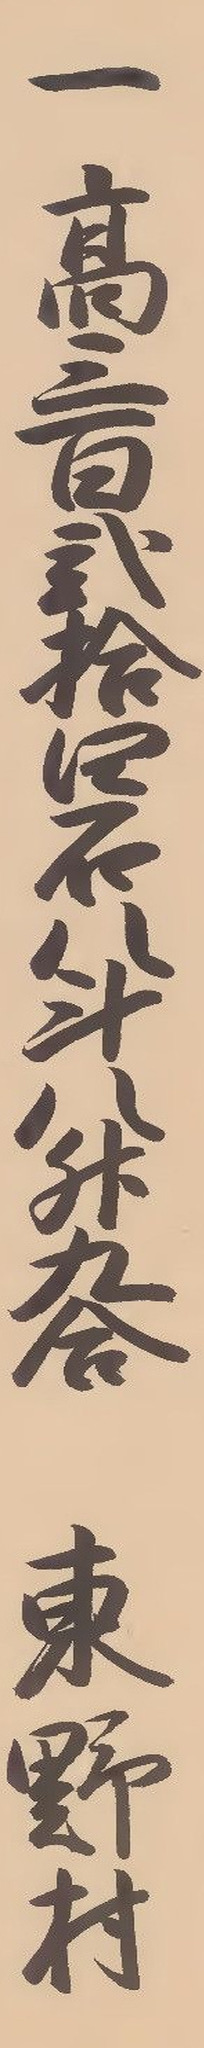一高三百弐拾四石八斗八升九合東野村
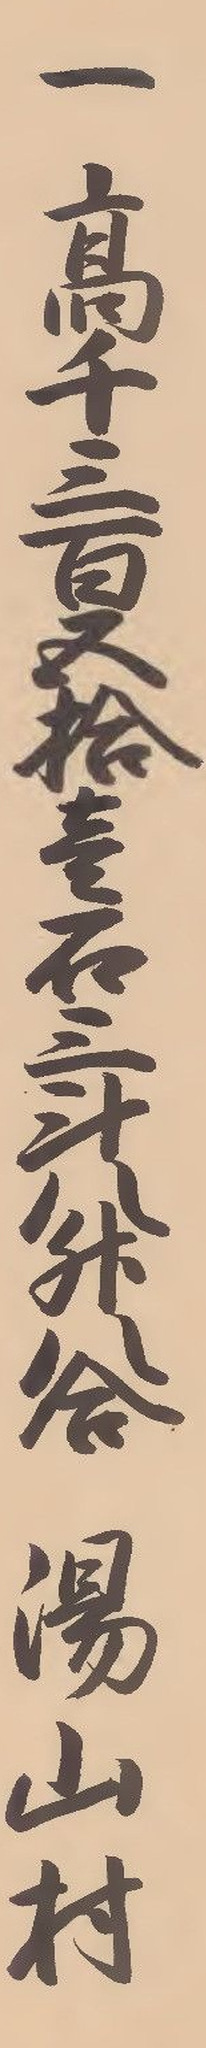一高千三百五拾壱石三斗八升八合湯山村
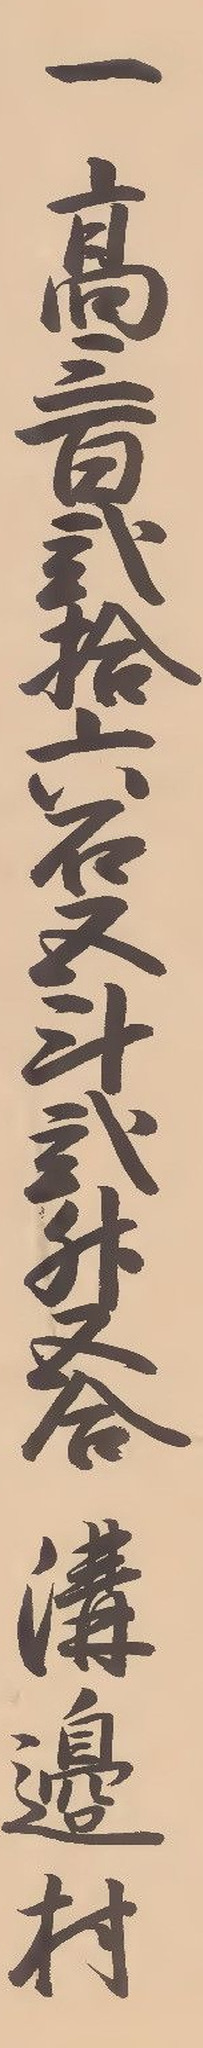一高三百弐拾六石五斗弐升五合溝辺村
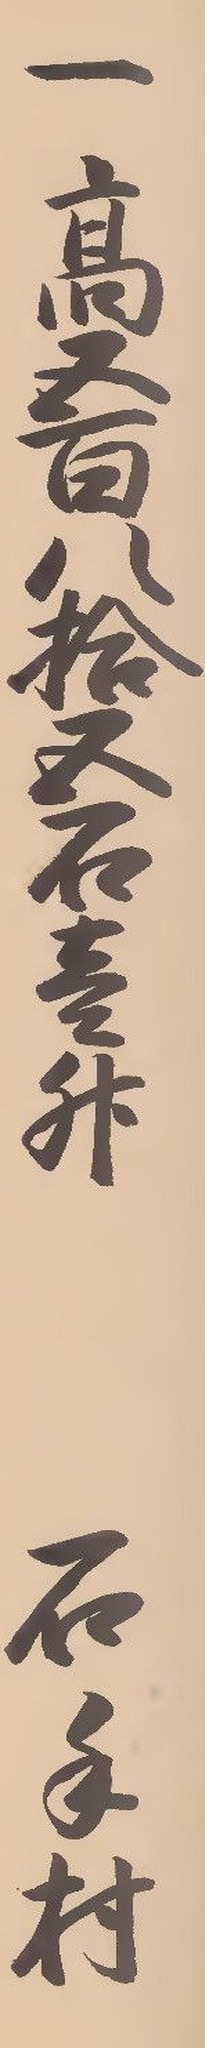一高五百八拾五石壱升石手村
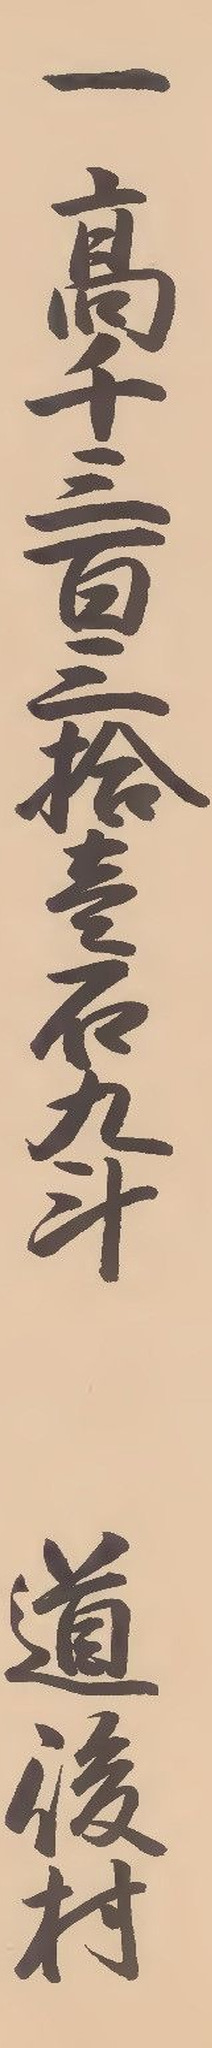一高千三百三拾壱石九斗道後村
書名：伊予国郷帳
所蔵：国立公文書館 National Archives of Japan
